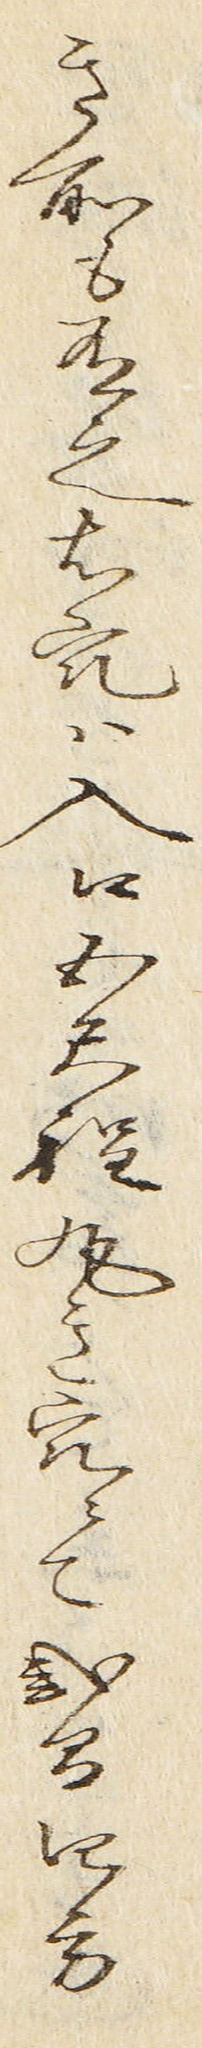き所も有之右穴は入口五尺程丸き穴にて弐間四方
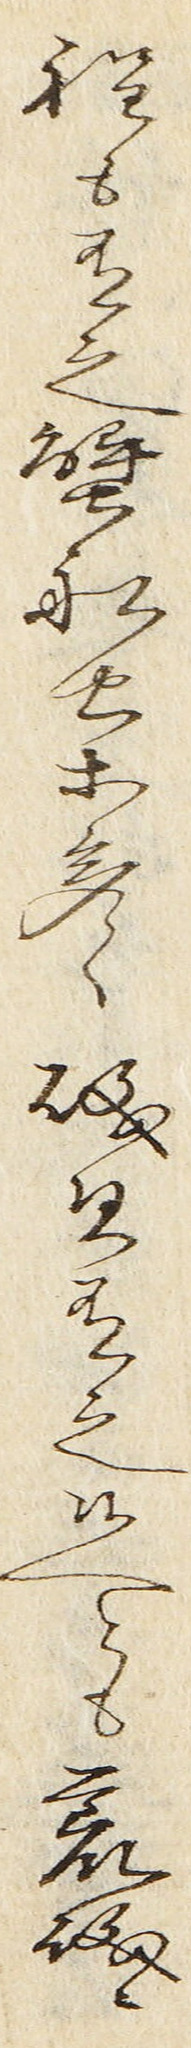程も有之蟹船虫等多く礒貝有之候へとも荒礒に
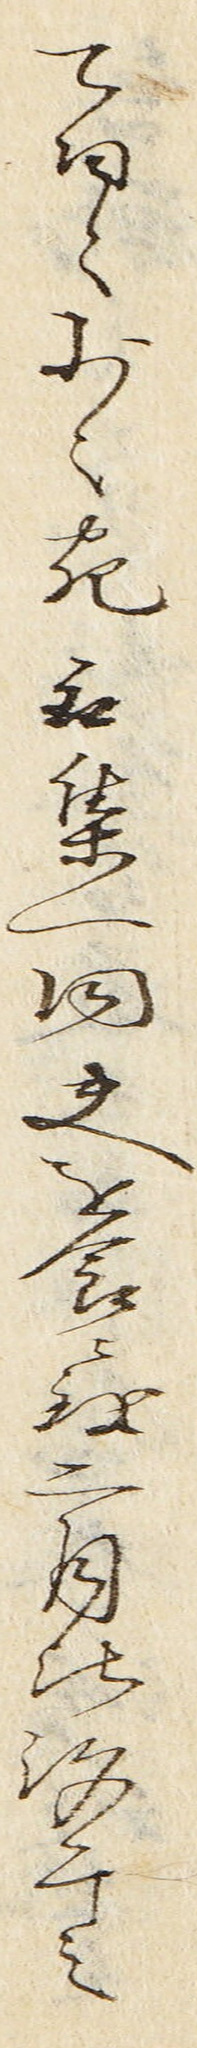て日々少々宛取集一同夫を食に致二月比汐干之
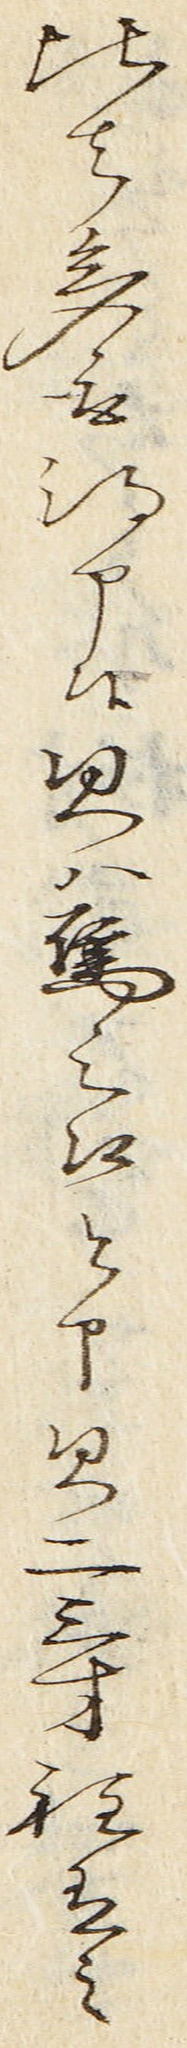比は多取得申候貝は烏之口と申貝二三才程有之
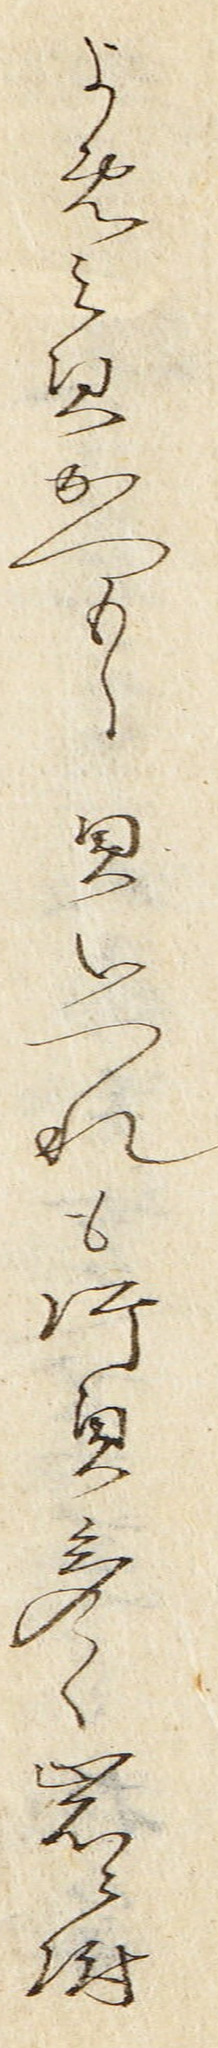よめみ貝かつもし貝いつれも片貝多く岩に附
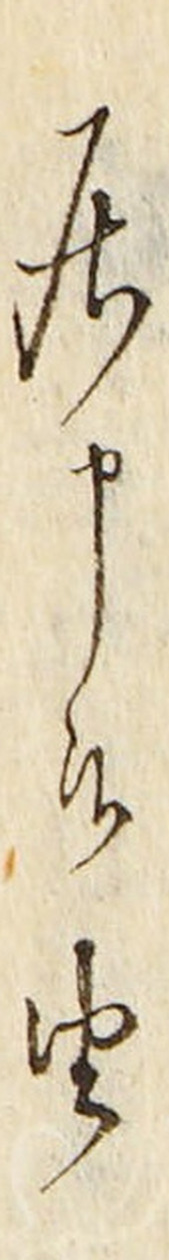居申候由

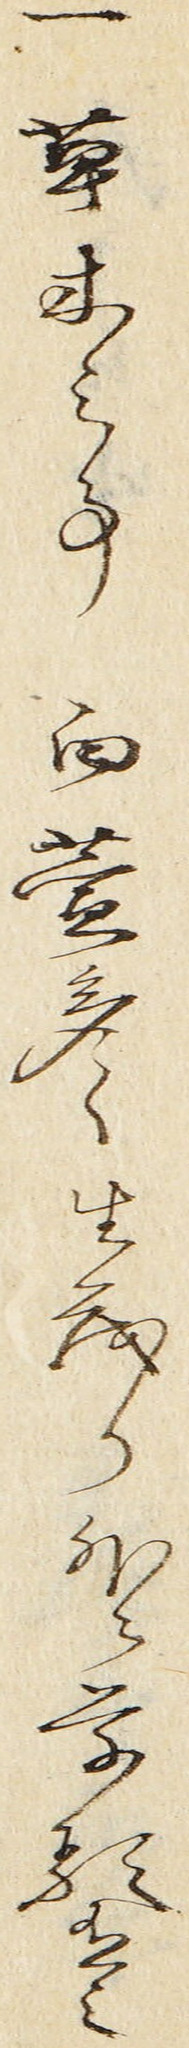一草木之事白萱多く生茂り外に草類有之
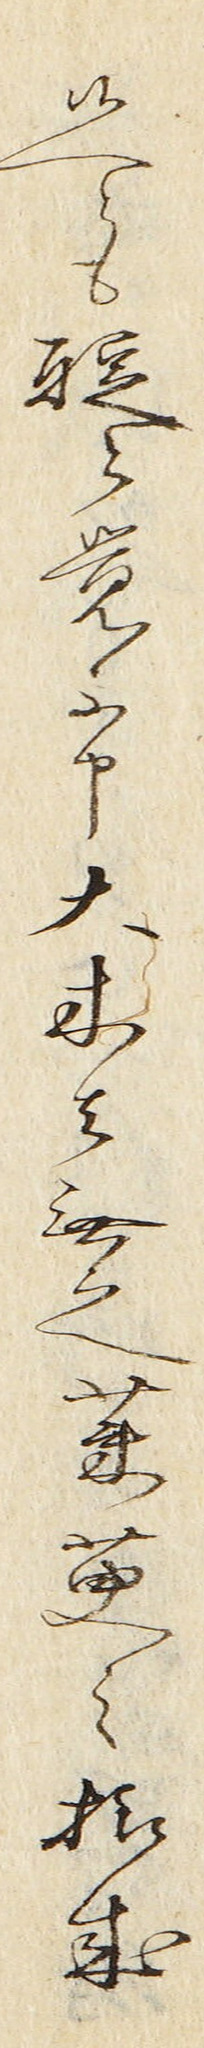候へとも聢と覚不申大木は無之茱茰之様成
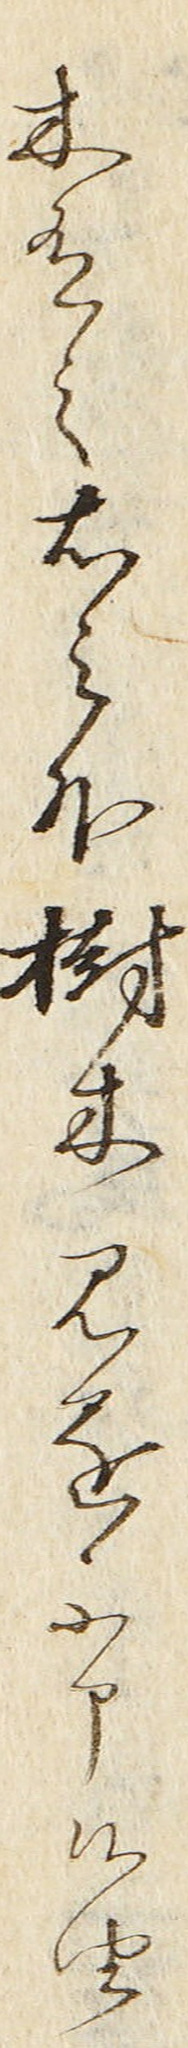木有之右之外樹木見懸不申候由
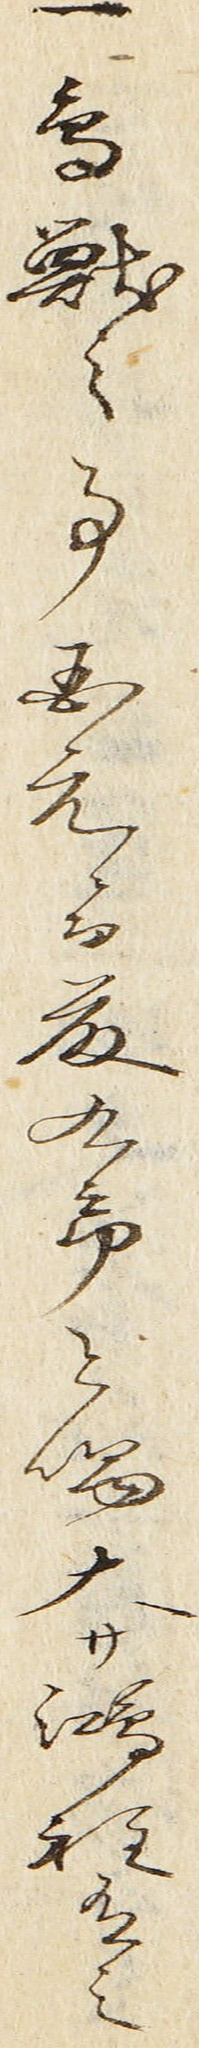一鳥獣之事国元に而藤九郎と唱大さ鴻程有之
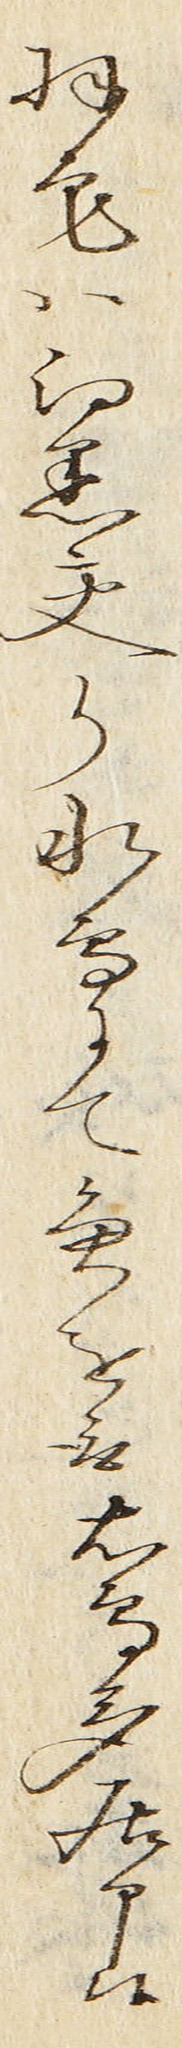羽毛は白黒交り水鳥にて魚を取右鳥多居申候
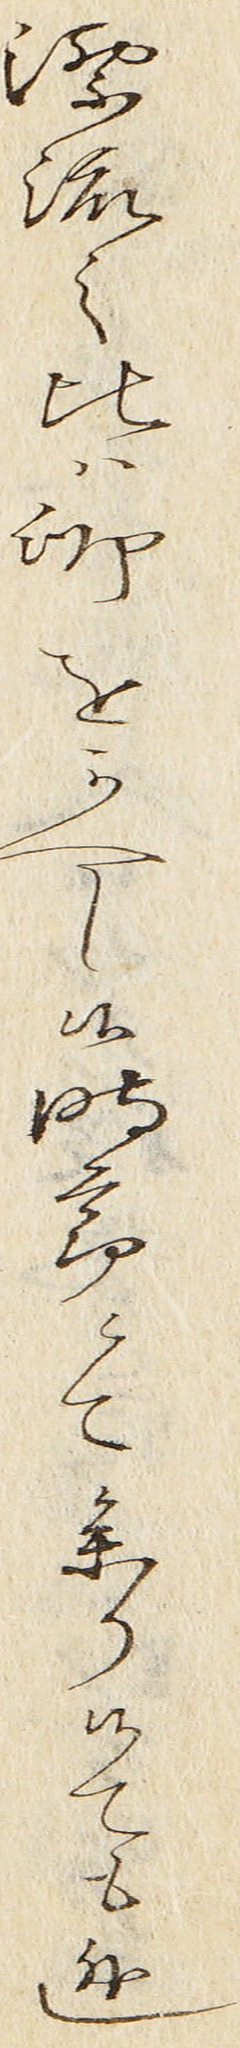漂流之比は卵をかへし候にて参り候ても逃
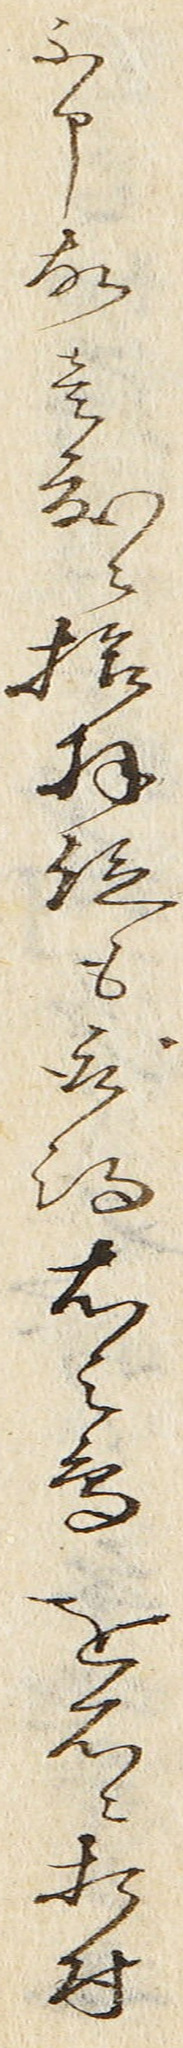不申故壱度に拾羽位も取得右之鳥を石に打付
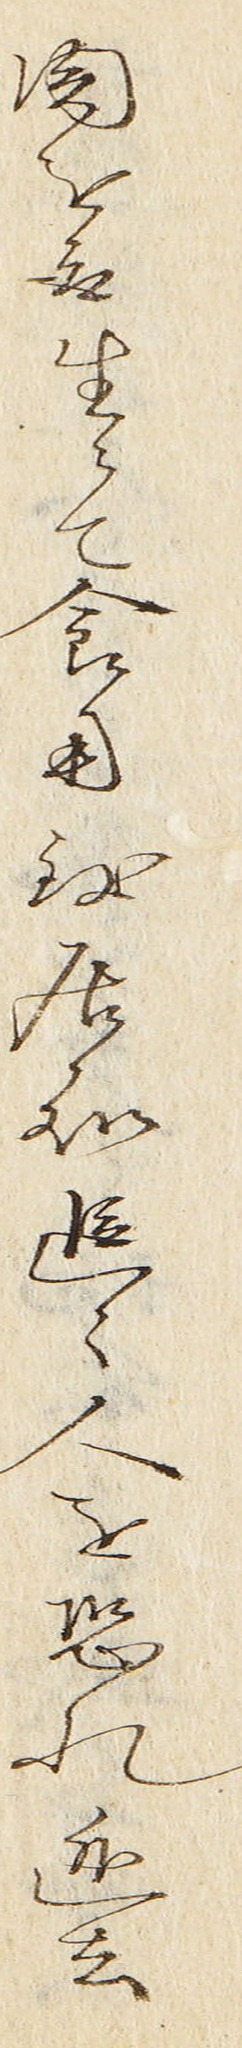肉を取生にて食用致居候追々人を恐れ逃去
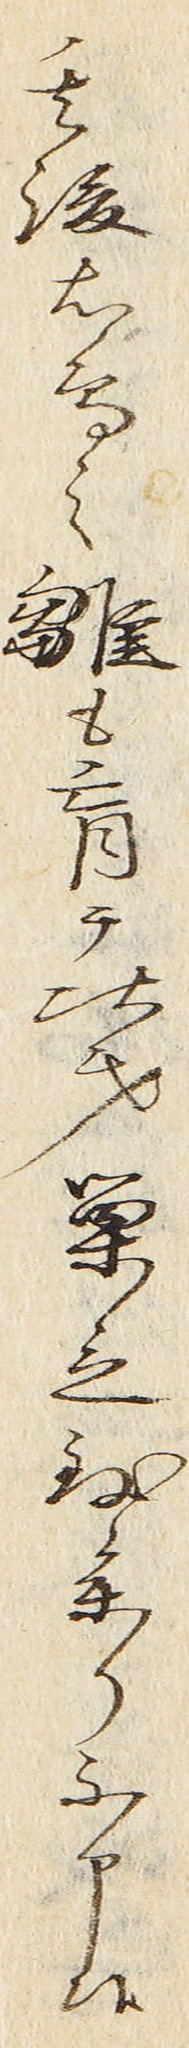其後右鳥之雛も育ち次第巣立致参り不申候
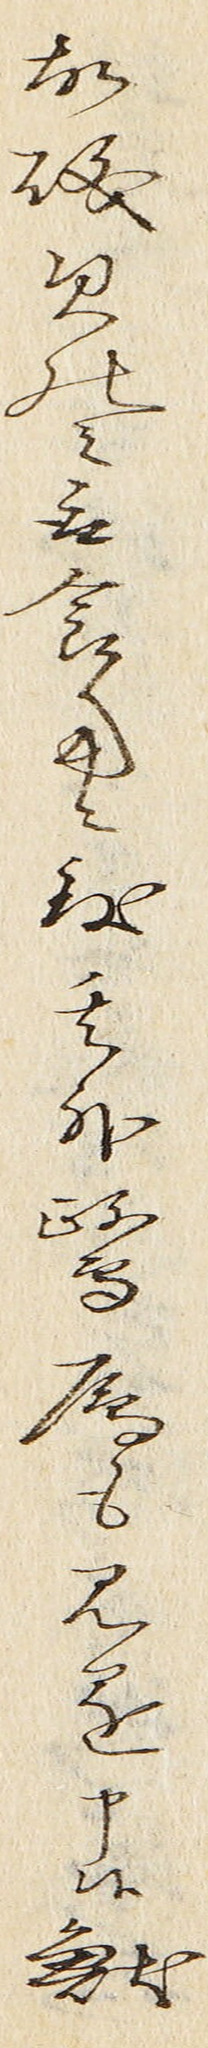故礒貝のみ取食用に致其外鷺鳫も見懸申候獣
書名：土佐中浜万次郎漂流記
